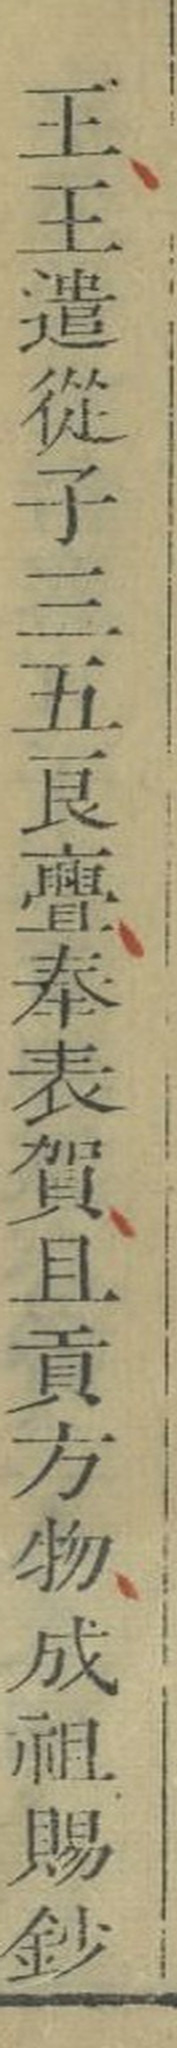王王遣従子三五良亹奉表賀且貢方物成祖賜鈔
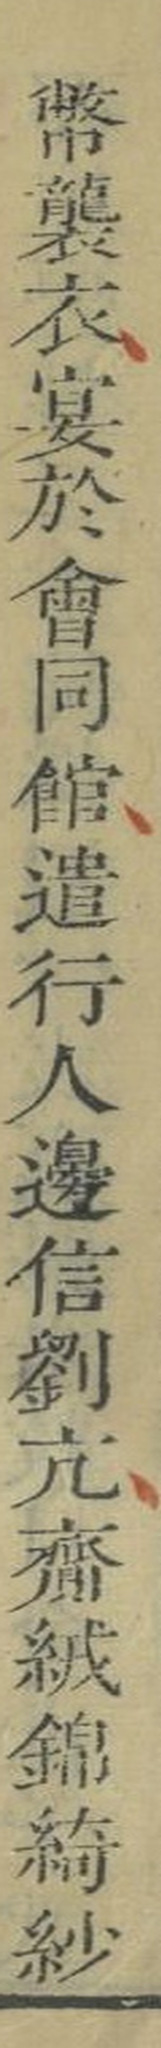幣襲衣宴於会同館遣行人辺信劉亢齎絨錦綺紗
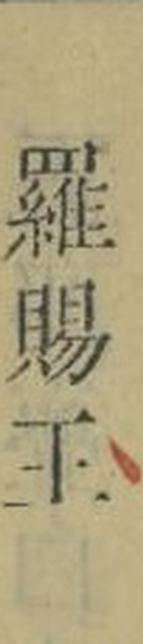羅賜王
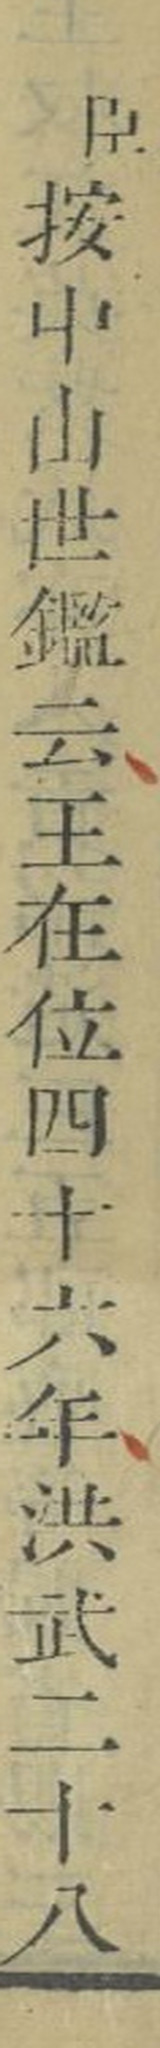臣按中山世鑑云王在位四十六年洪武二十八
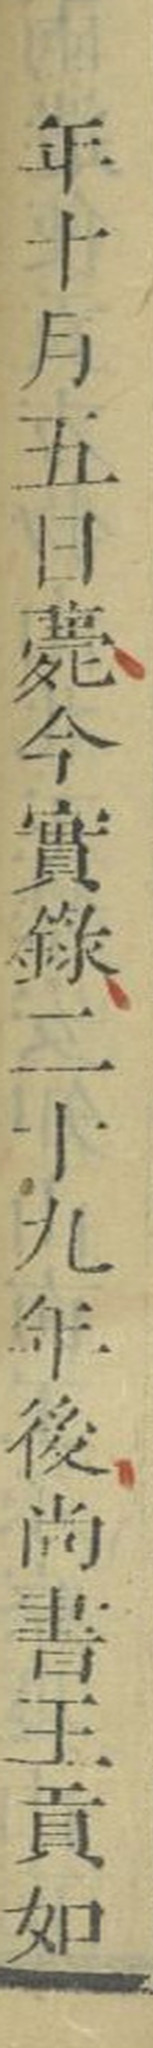年十月五日薨今実録二十九年後尚書王貢如
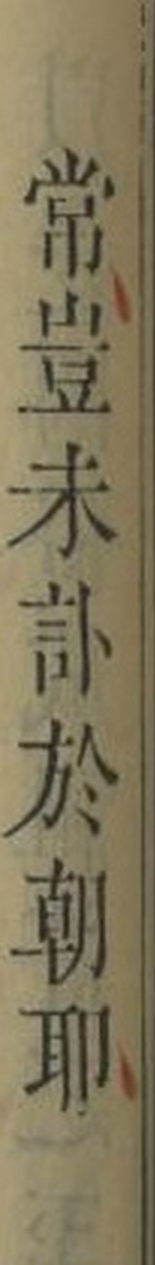常豈未訃於朝耶
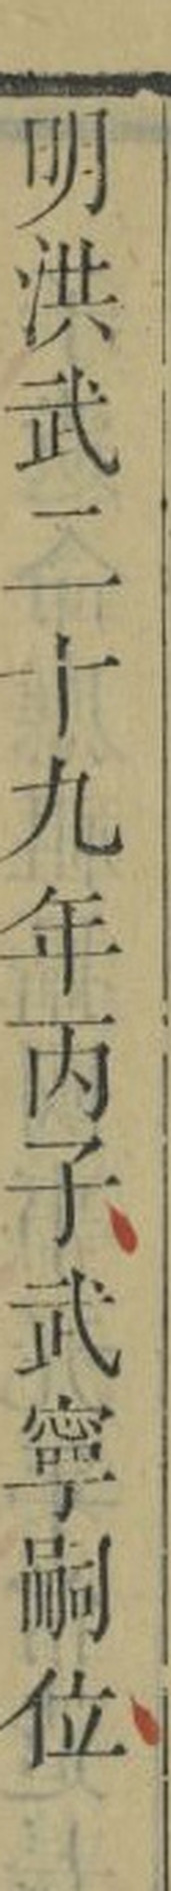明洪武二十九年丙子武寧嗣位
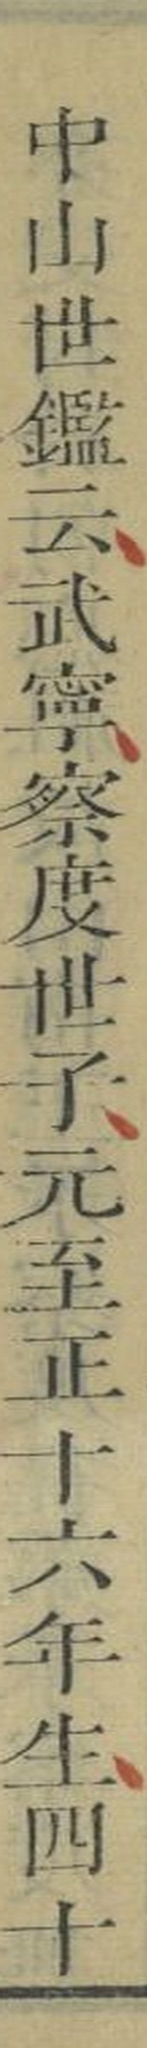中山世鑑云武寧察度世子元至正十六年生四十
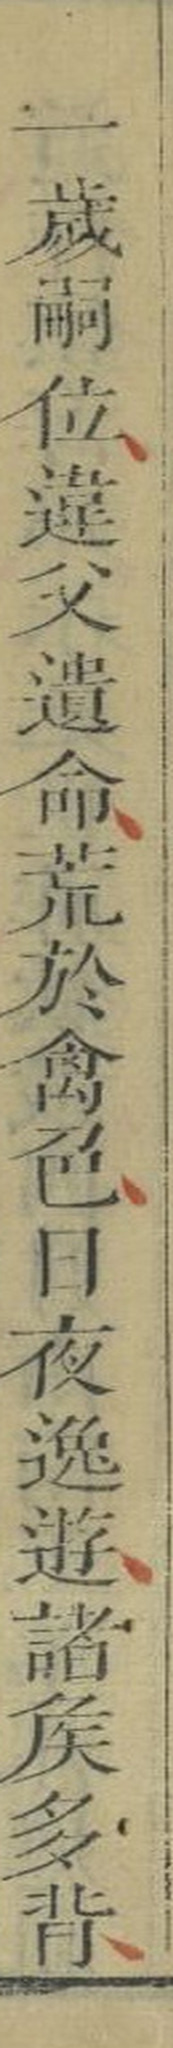一歳嗣位違父遺命荒於禽色日夜逸遊諸侯多背
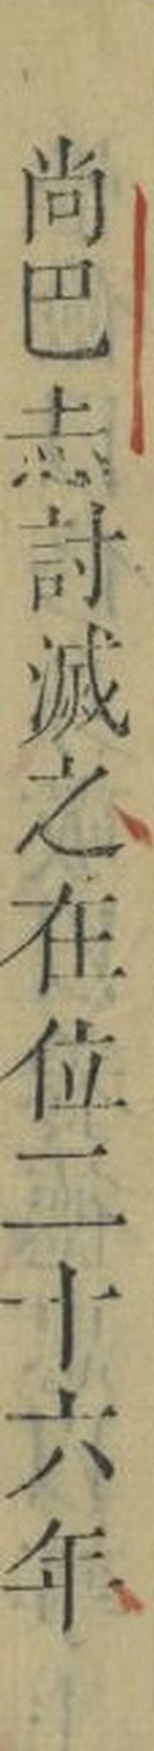尚巴志討滅之在位二十六年
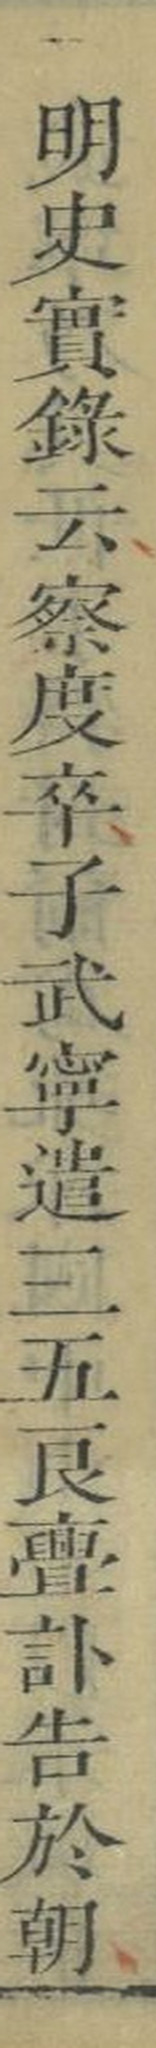明史実録云察度卒子武寧遣三五良亹訃告於朝
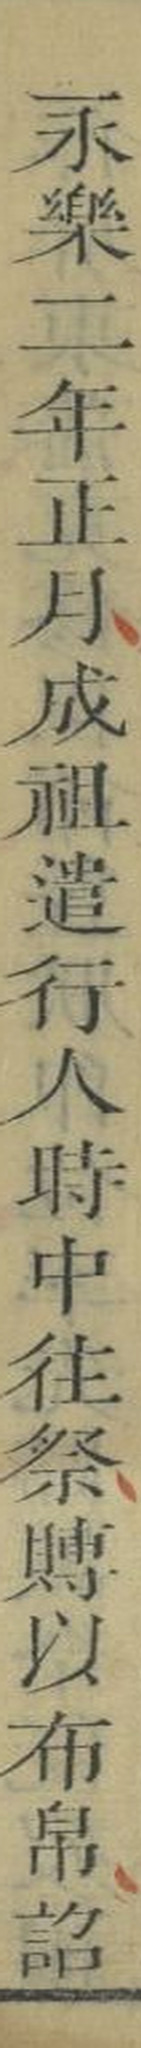永楽二年正月成祖遣行人時中往祭賻以布帛詔
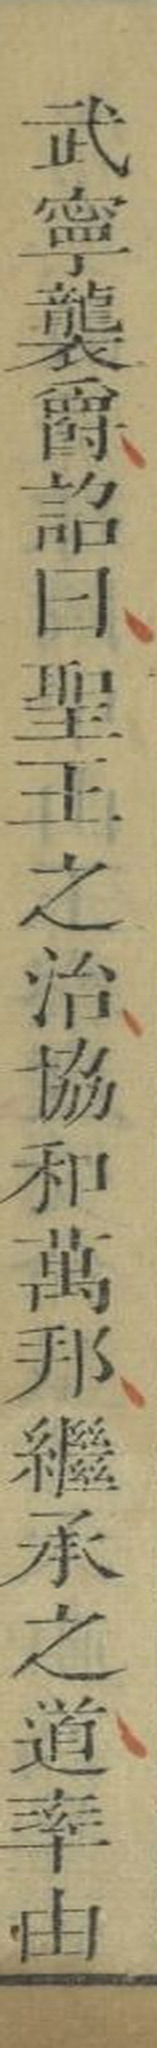武寧襲爵詔曰聖王之治協和万邦継承之道率由

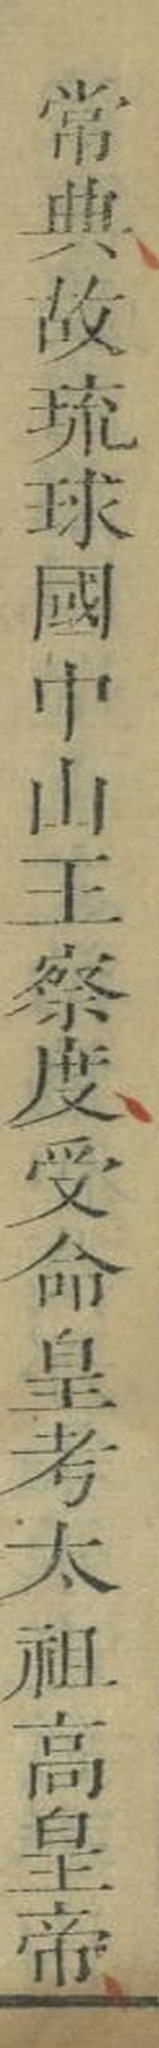常典故琉球国中山王察度受命皇考太祖高皇帝
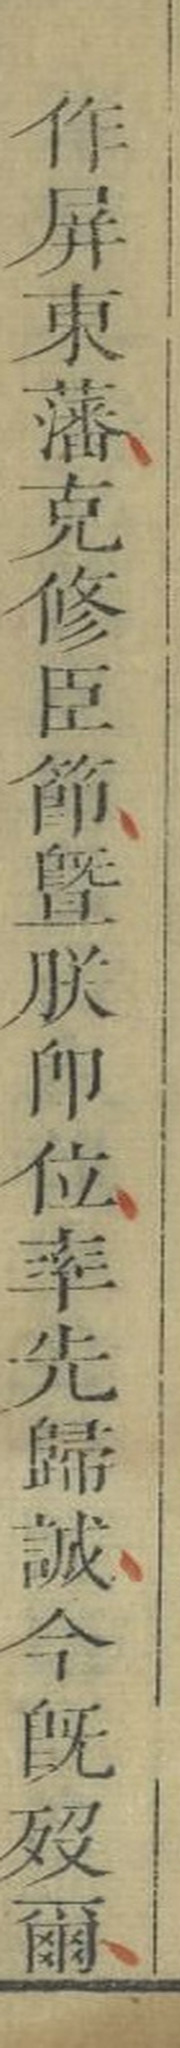作屏東藩克修臣節曁朕即位率先帰誠今既歿爾
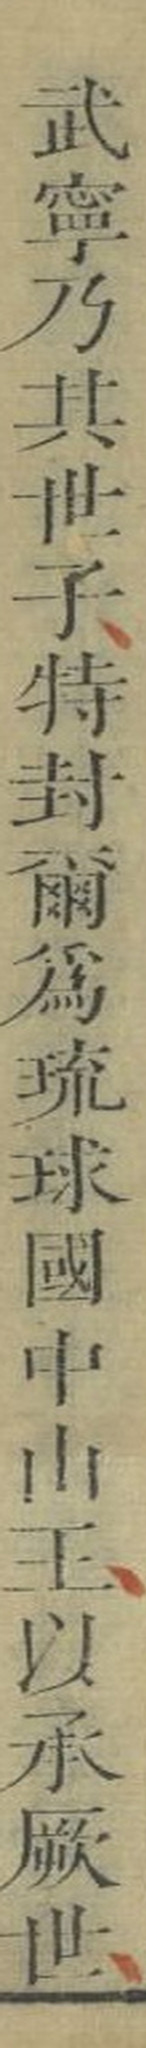武寧乃其世子特封爾為琉球国中山王以承厥世
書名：中山伝信録 巻三
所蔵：University of the Ryukyus Library
